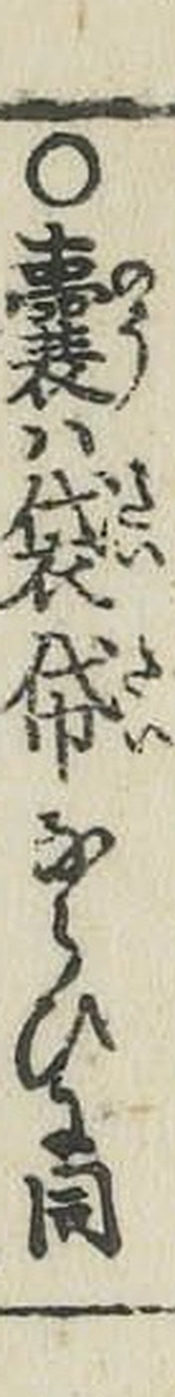○嚢は袋帒ならひに同
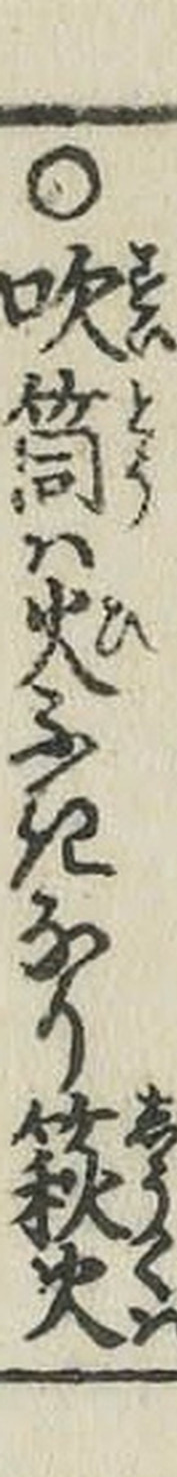○吹筒は火ふきなり篍火
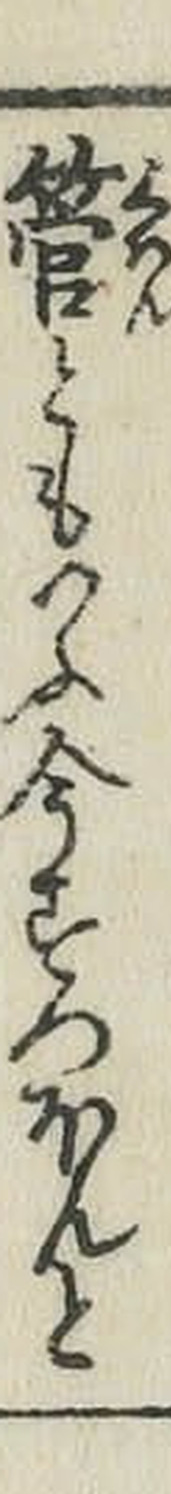管ともいふ今すつほんと
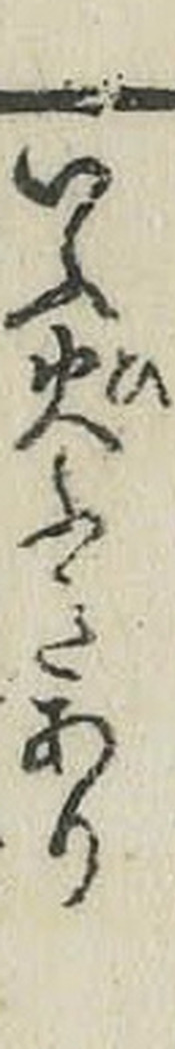いふ火ふきあり
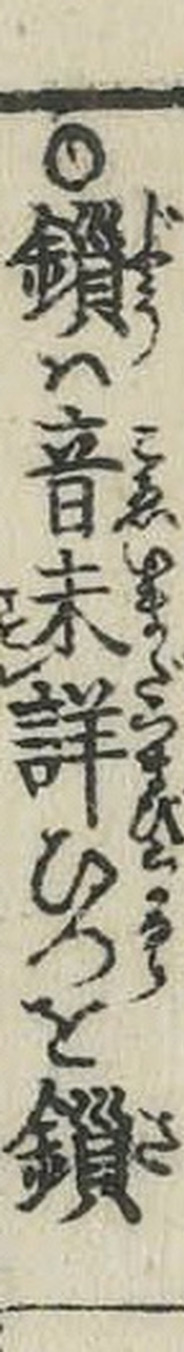○鎖は音未詳ひつを鎖

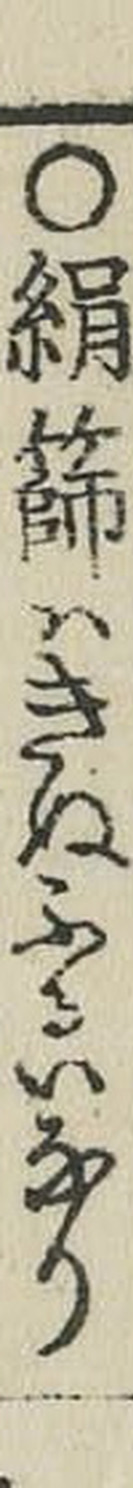○絹篩はきぬふるいなり
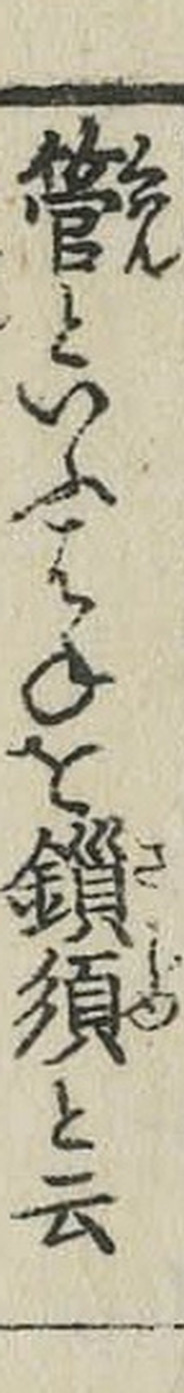管といふはねを鎖須と云
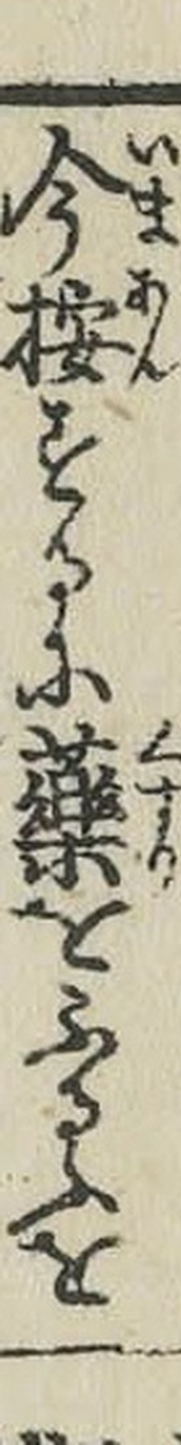今按するに薬をふるふを
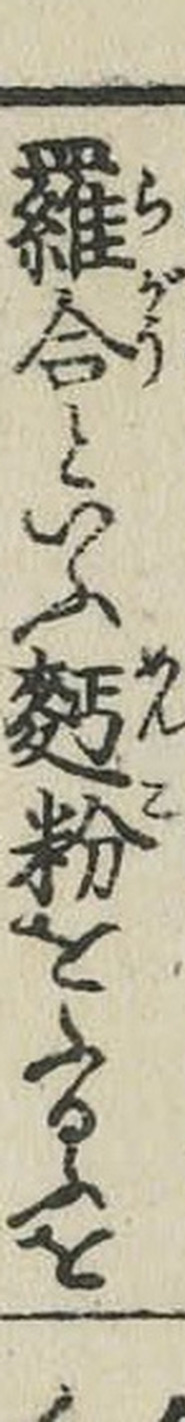羅合といふ麺粉をふるふを
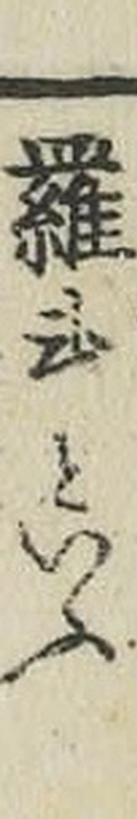羅斗といふ
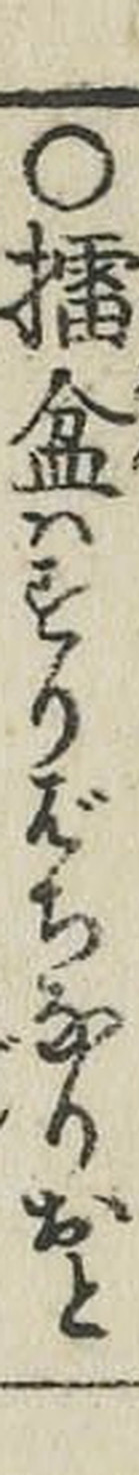○擂盆はすりばちなりおと
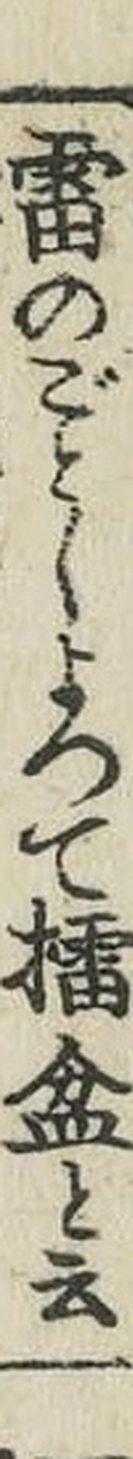雷のごとしよつて擂盆と云
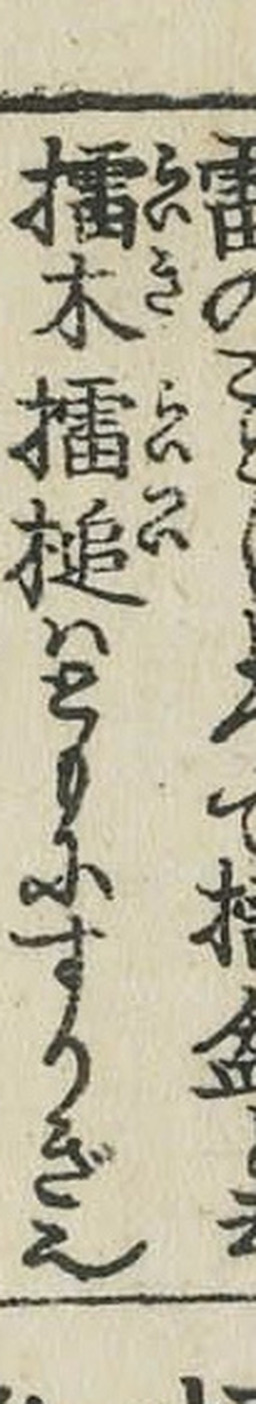擂木擂槌はともにすりぎ也
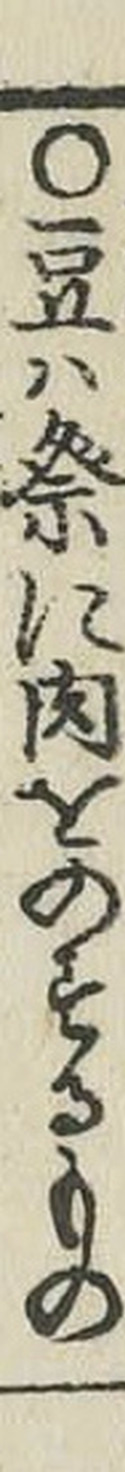○豆は祭に肉をのするもの
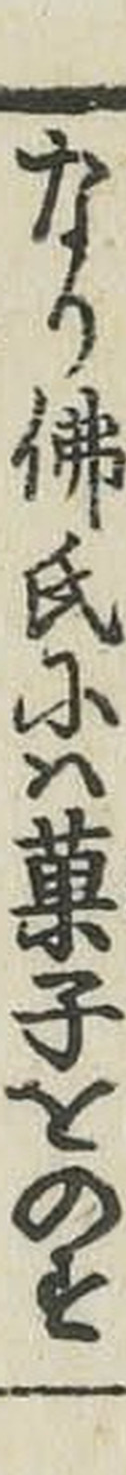なり仏氏には菓子をのす
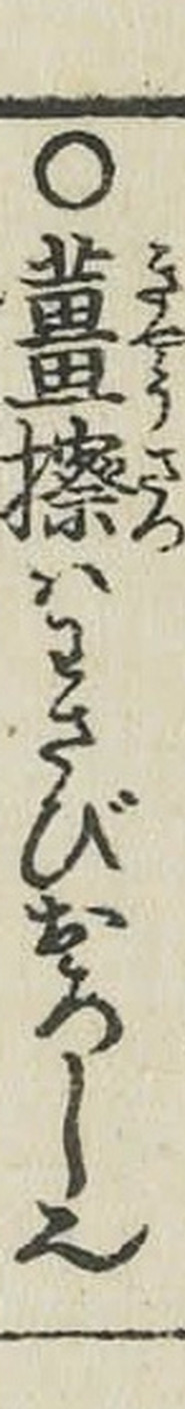○薑擦はわさびおろし也
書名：増補頭書訓蒙図彙大成 10巻 5:巻之9-11
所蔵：東京学芸大学教育コンテンツアーカイブ
